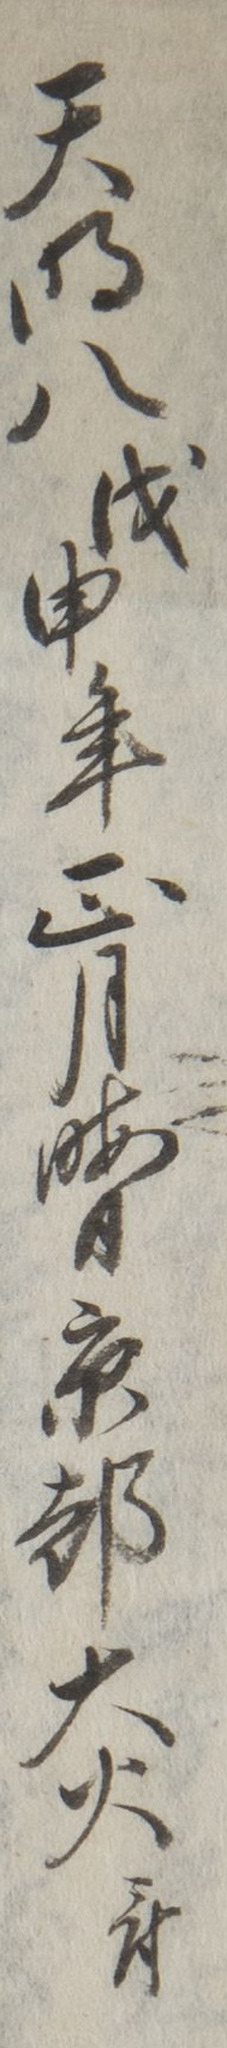天明八戊申年正月晦日京都大火に付
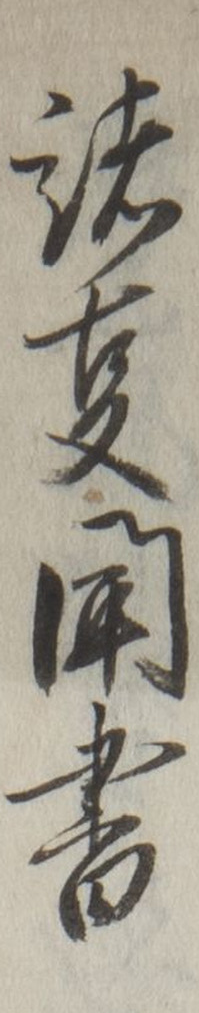諸事聞書
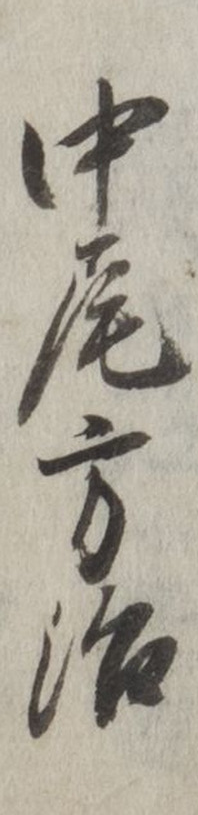中尾方治

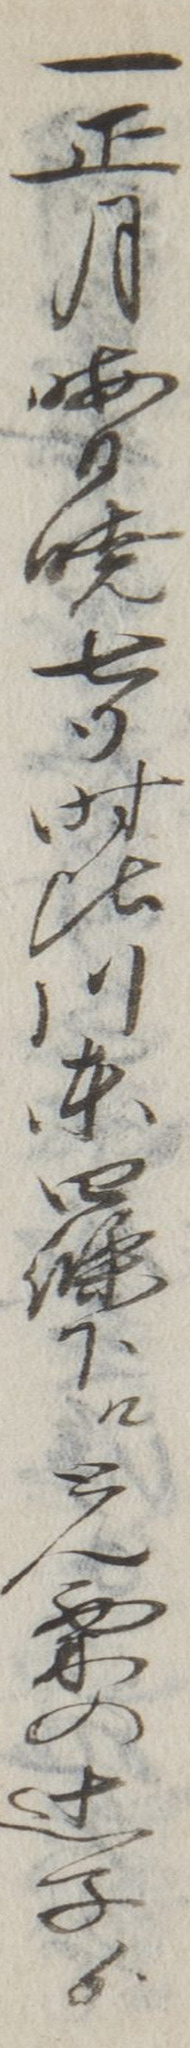一正月晦日暁七ツ時頃川東四条下るとん栗の辻子ゟ
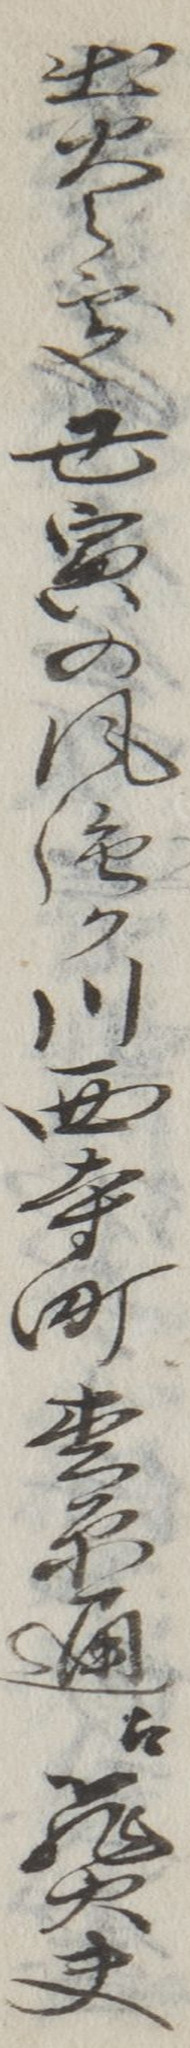出火之処丑寅の風強く川西寺町松原通え飛火夫
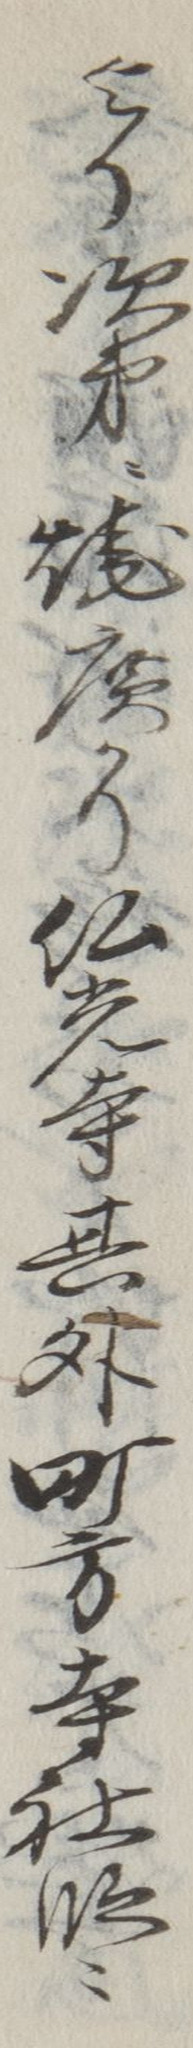より次第に焼広かり仏光寺其外町方寺社段々
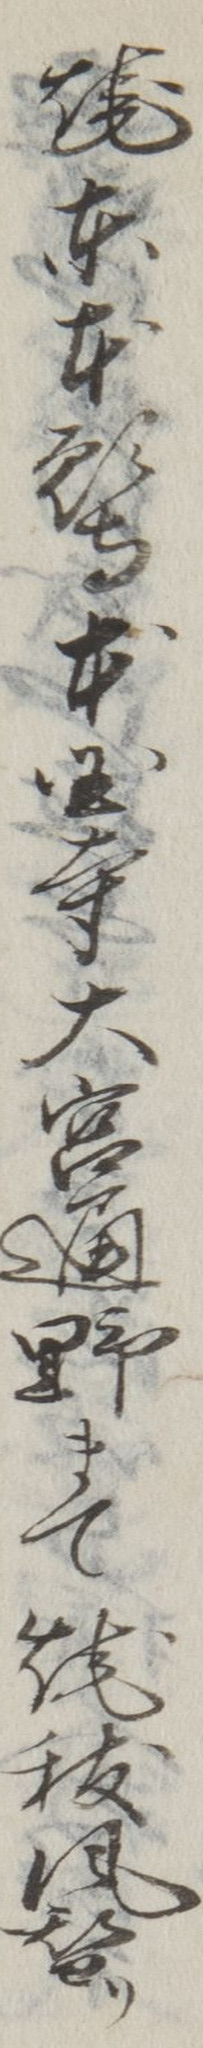焼東本願寺本国寺大宮通野まて焼秡風替り
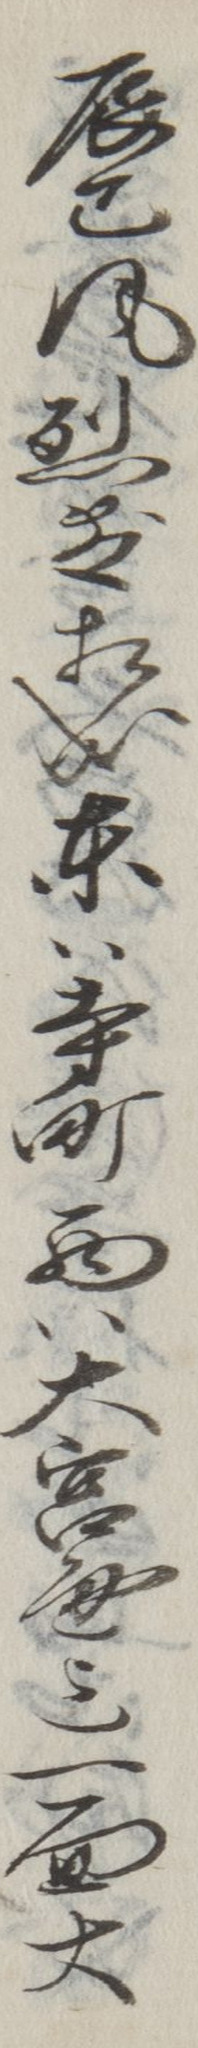辰巳風烈敷相成東は寺町西は大宮通迄一面大
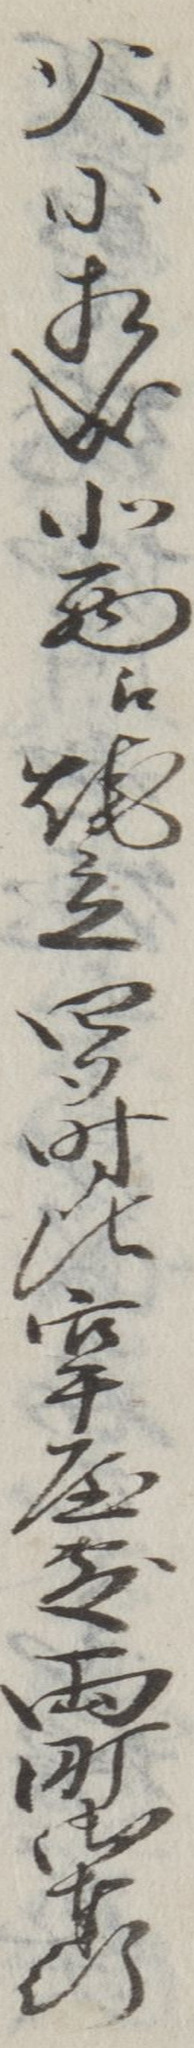火に相成北西え焼立四ツ時の頃牢屋敷両町御奉行
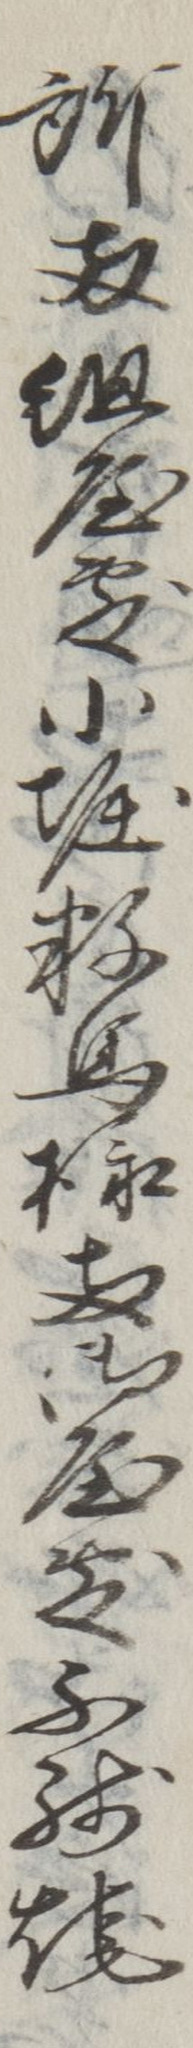所両組屋敷小堀数馬様両御屋敷不残焼
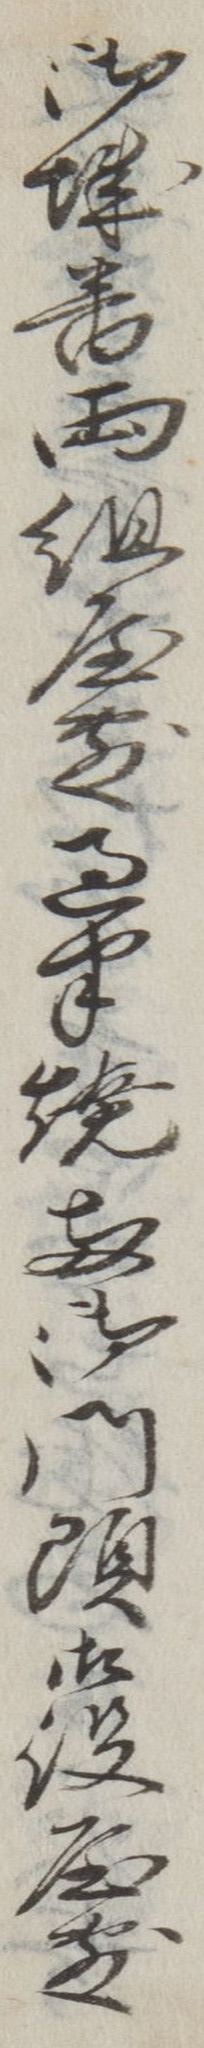御城番両組屋敷過半焼両御門頭御役屋敷
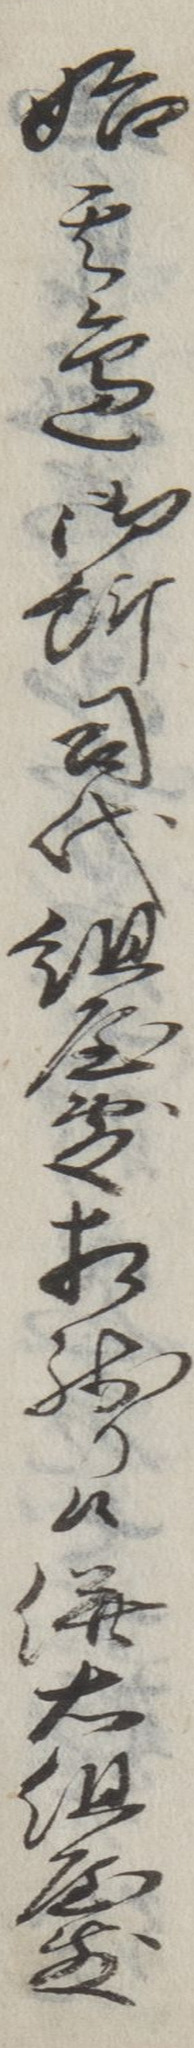始其辺御所司代組屋敷相残り候併右組屋敷

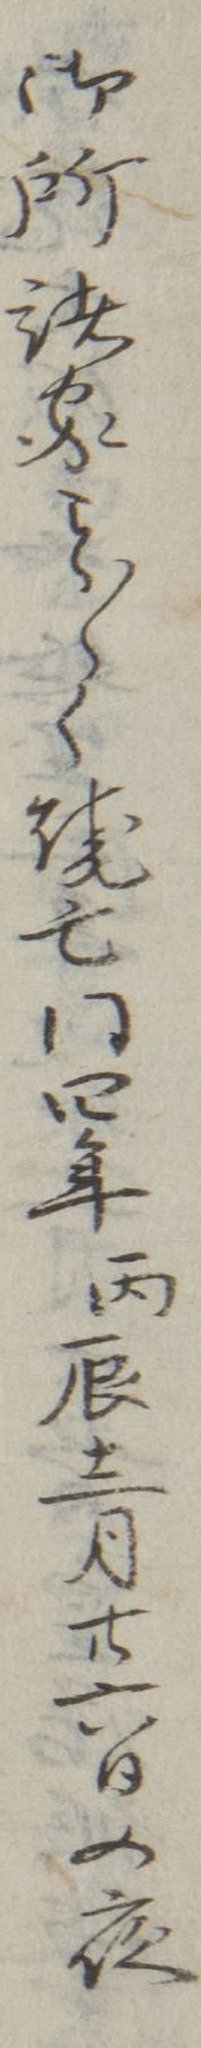御所諸家こと〳〵く焼亡同四年丙辰十二月廿六日の夜
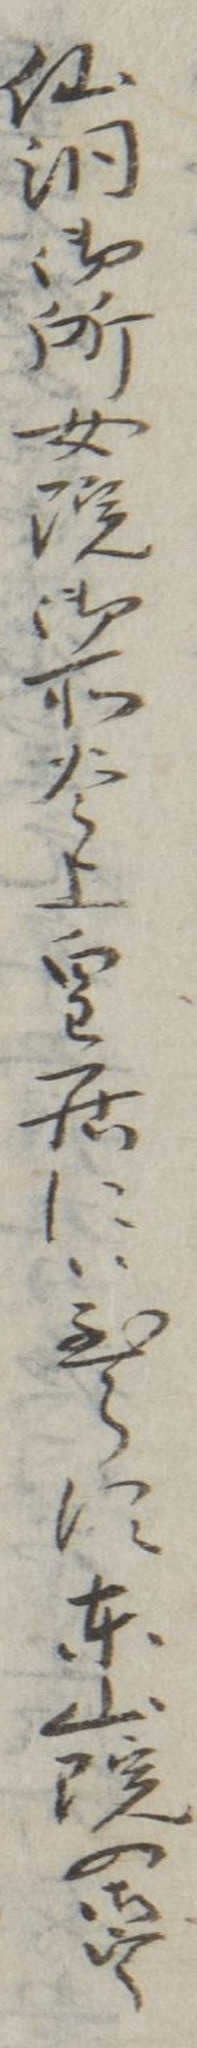仙洞御所女院御所炎上皇居には至らす東山院の御宇
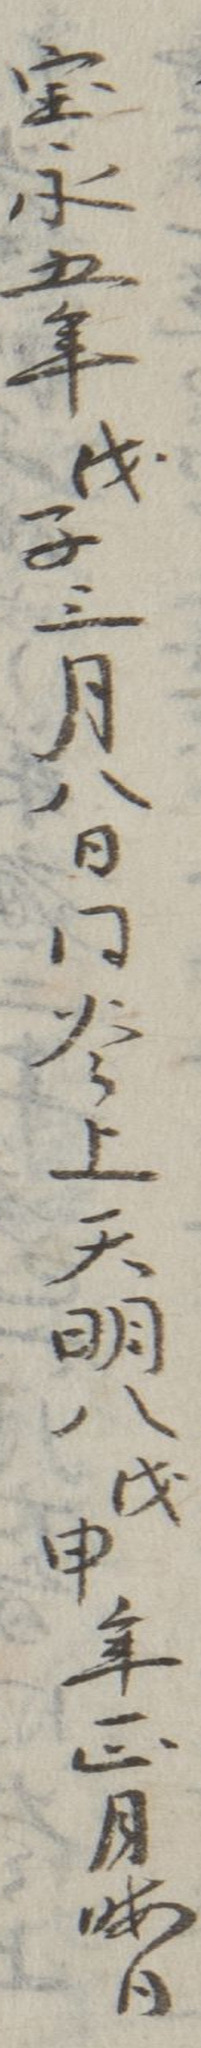宝永五年戊子三月八日同炎上天明八戊申年正月晦日
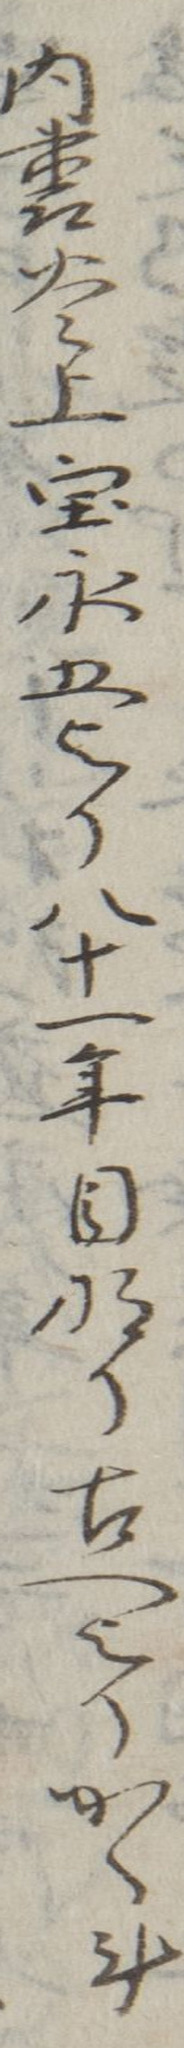内裏炎上宝永五より八十一年目なり古へよりかく計
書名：天明八年戊申年正月晦日京都大火ニ付諸事聞書
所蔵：あいおいニッセイ同和損保株式会社
